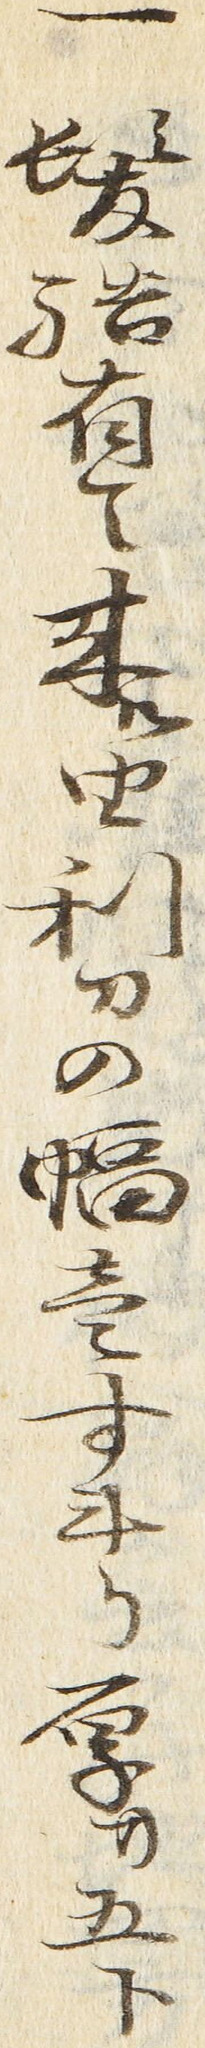一髪結有て来る由利刀の幅壱寸計り厚さ五分
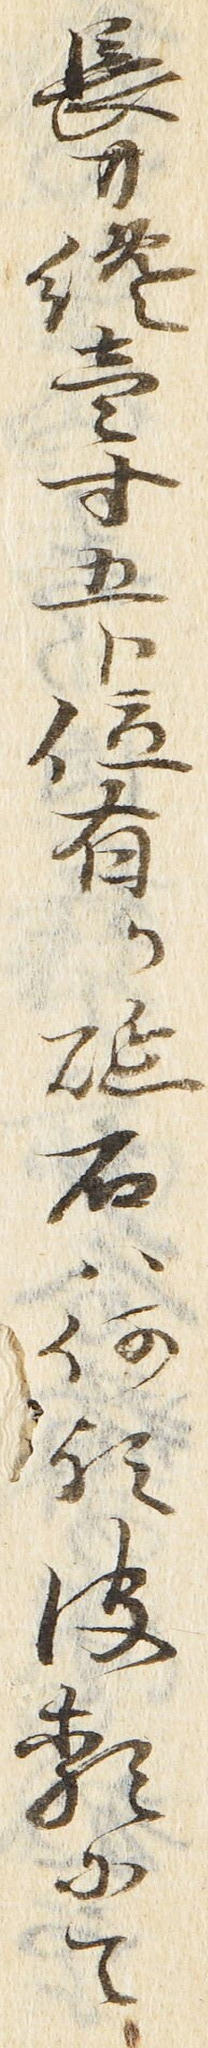長さ纔壱寸五分位有り砥石は何歟皮類にて
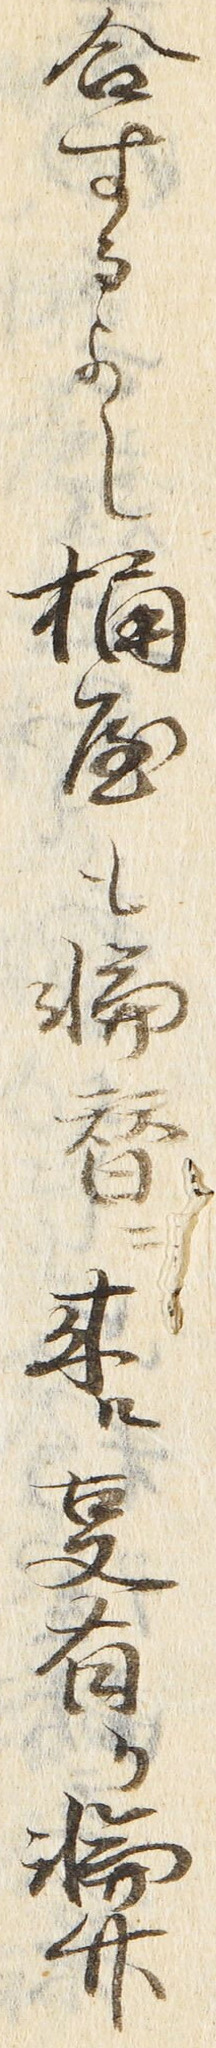合するよし桶屋も輪替に来る事有り輪竹
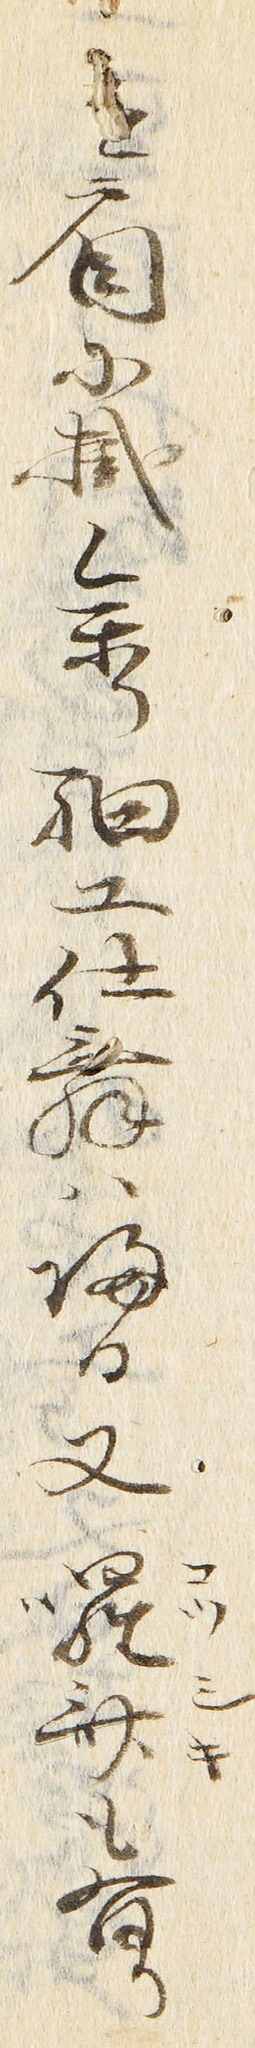肩に掛参り細工仕舞は帰る又囉斎も有り
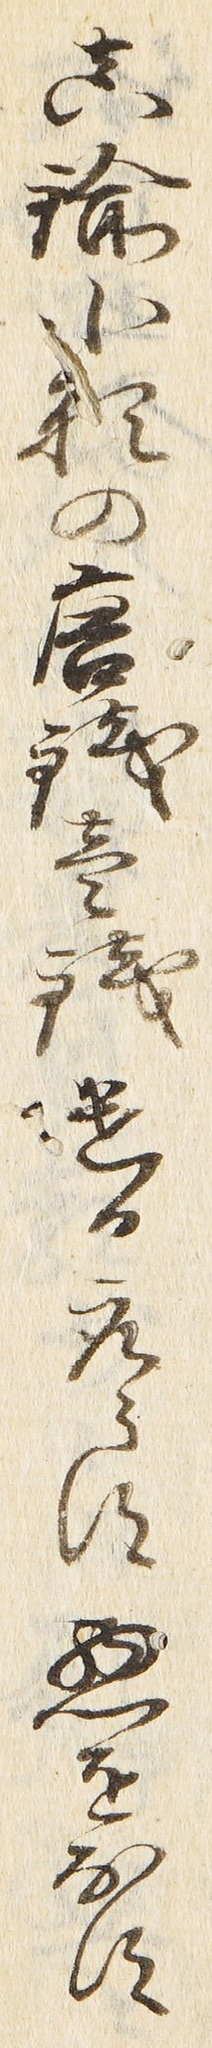真鍮小形の唐銭壱銭遣るとらす悪をなす
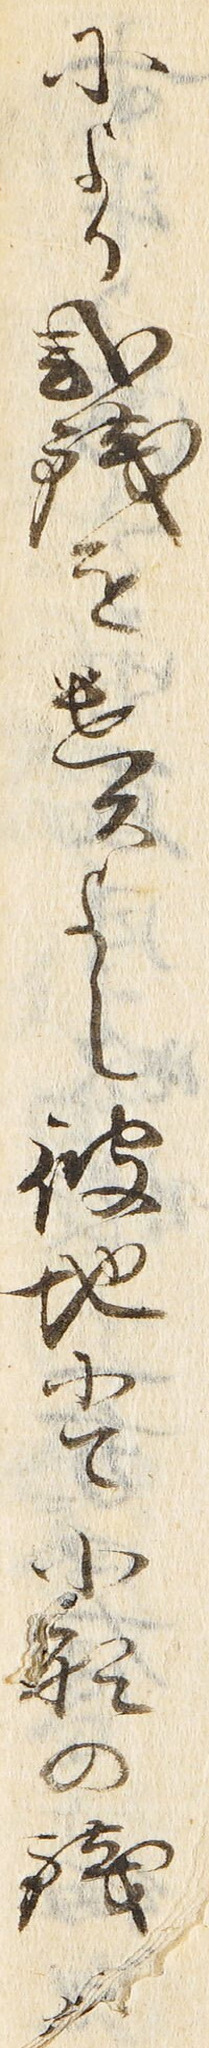により弐銭を遣すよし彼地にて小形の銭
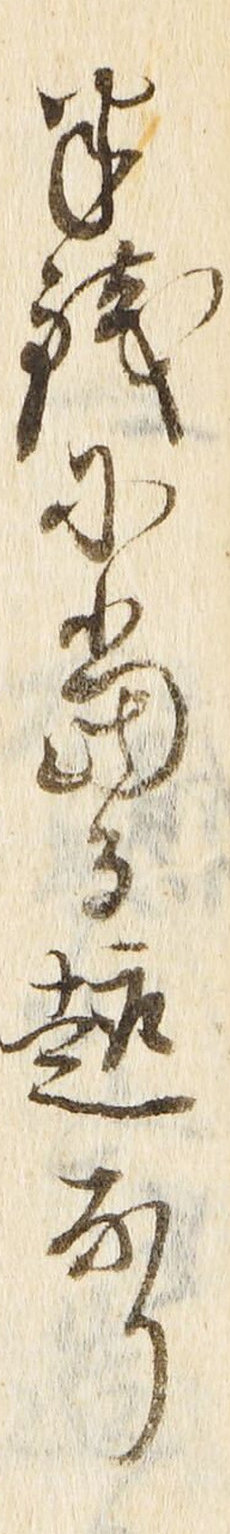半銭に当る趣なり
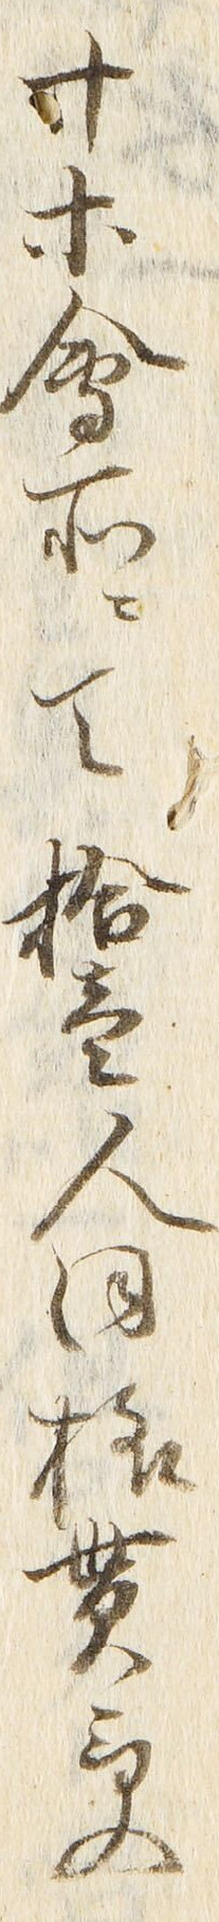サホ会所にて拾壱人同様貰受
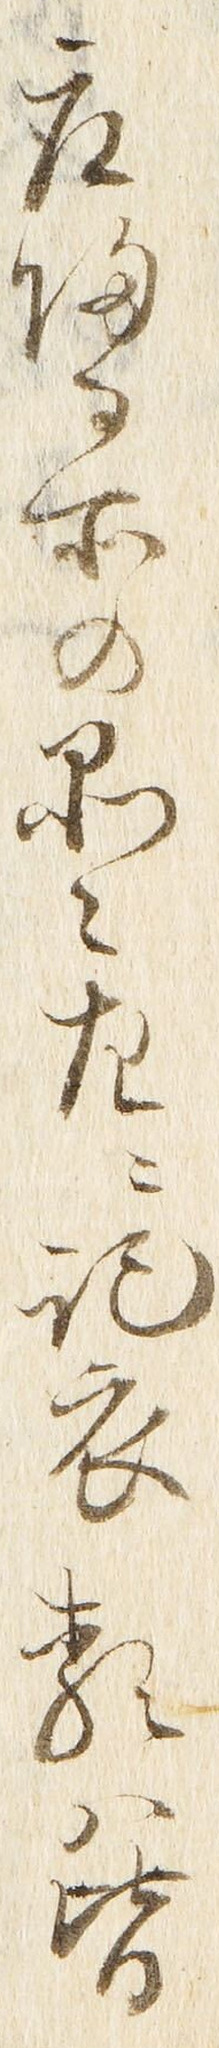取帰る所の品々左に記衣類は皆
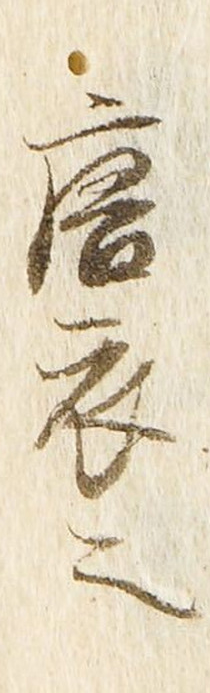唐衣也
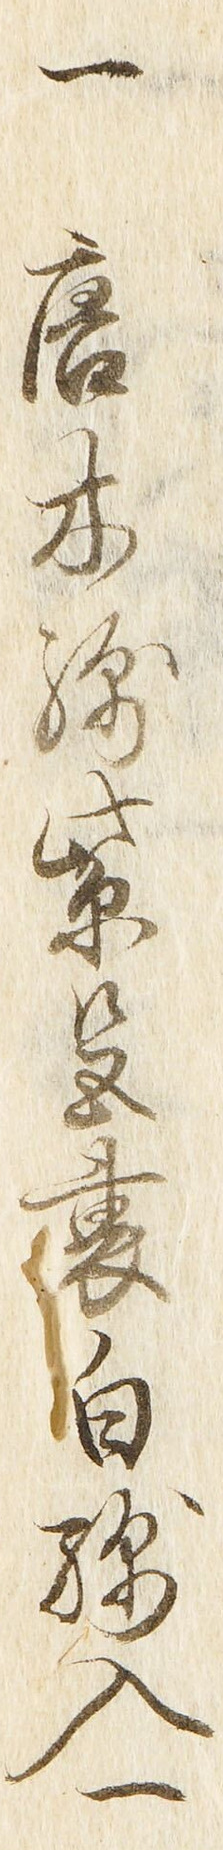一唐木綿紫色裏白綿入一
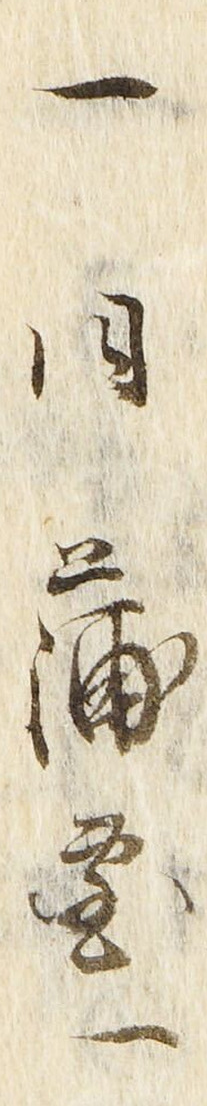一同蒲団一
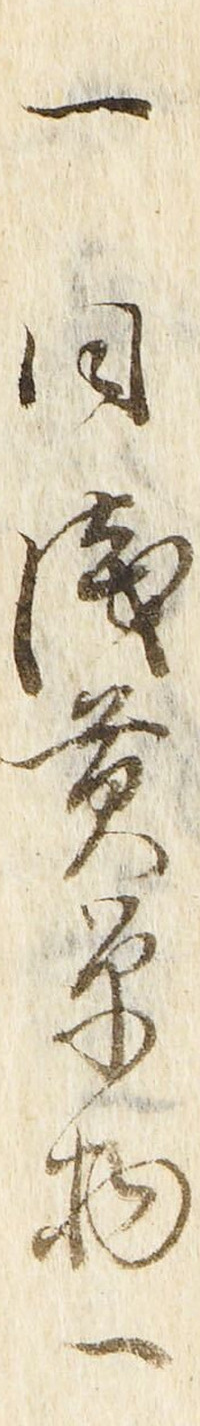一同浅黄単物一

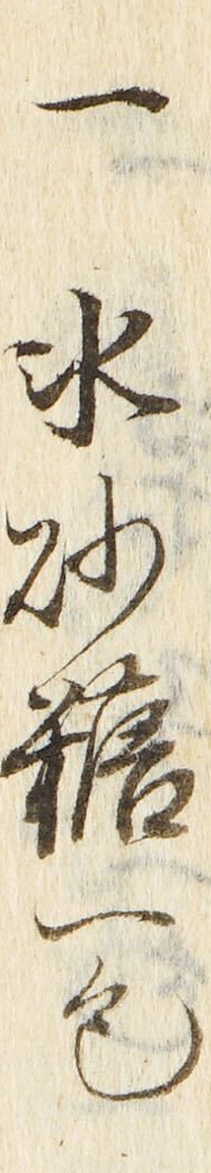一氷砂糖一包
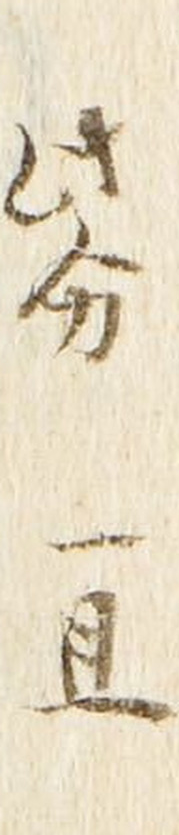此分一且
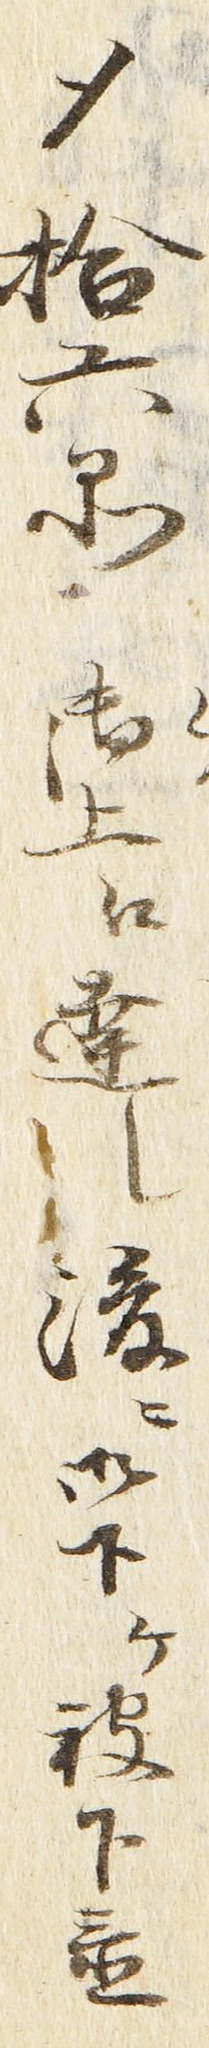〆拾六品御上え達し後に御下ヶ被下置
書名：唐物語
